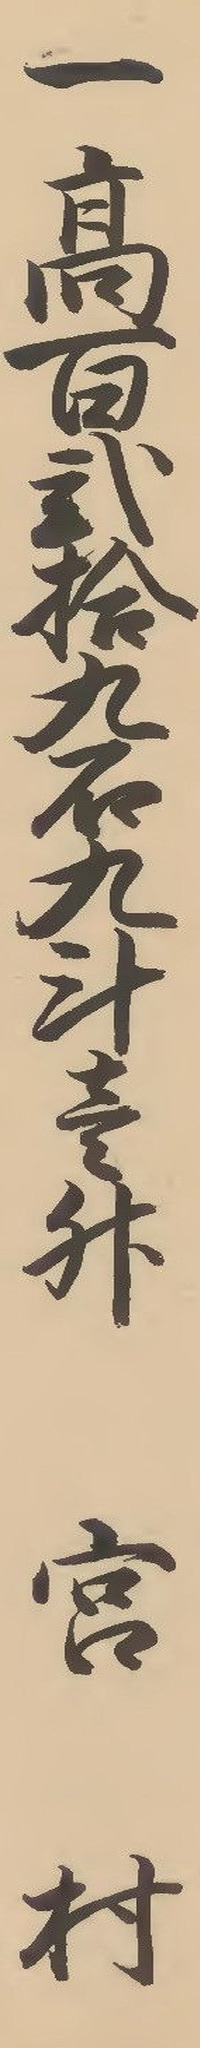一髙百弐拾九石九斗壱升宮村
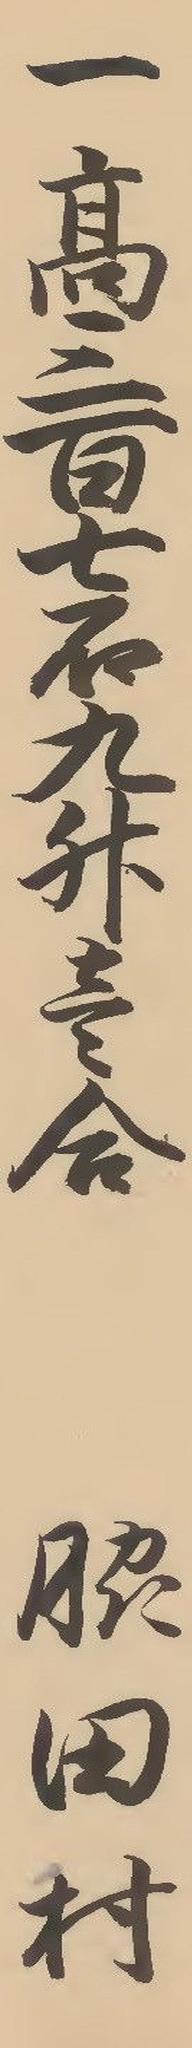一髙三百七石九升壱合脇田村

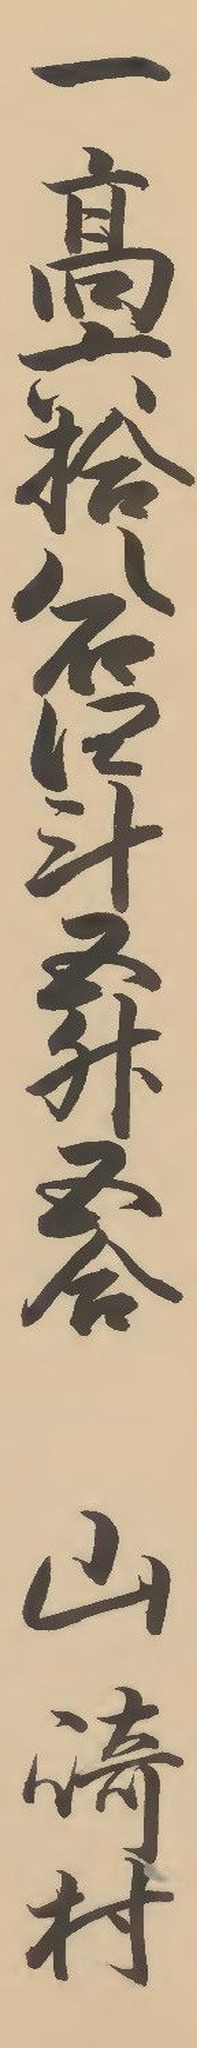一髙六拾八石四斗五升五合山崎村
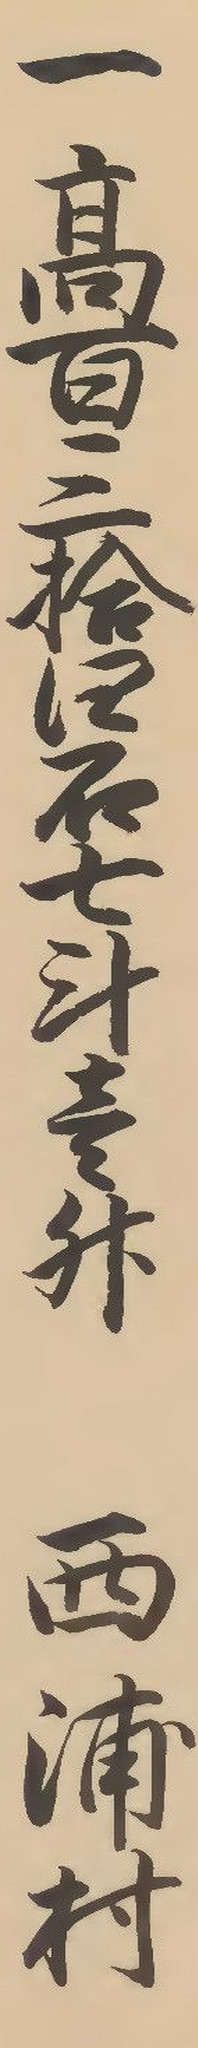一髙百三拾四石七斗壱升西浦村
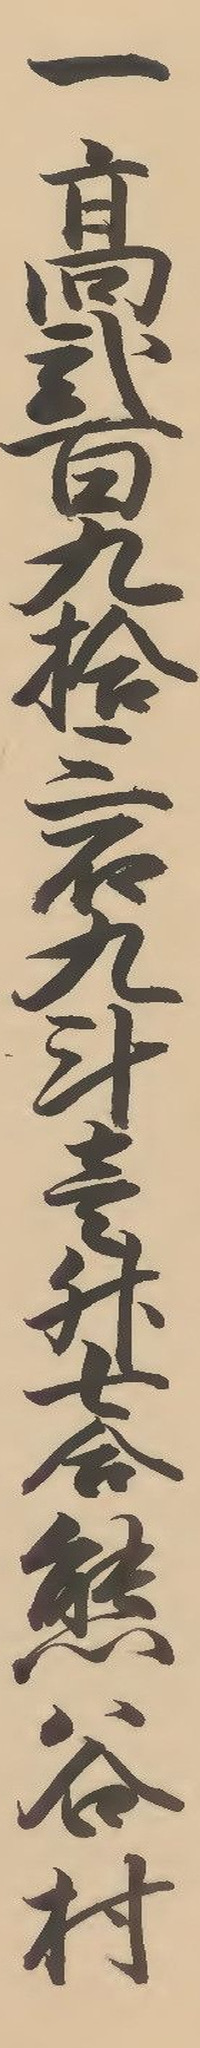一髙弐百九拾三石九斗壱升七合熊谷村
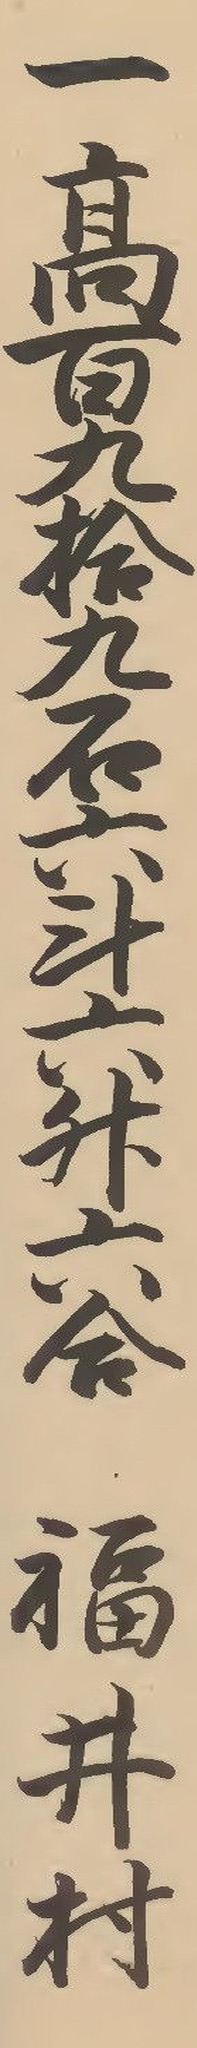一髙百九拾九石六斗六升六合福井村
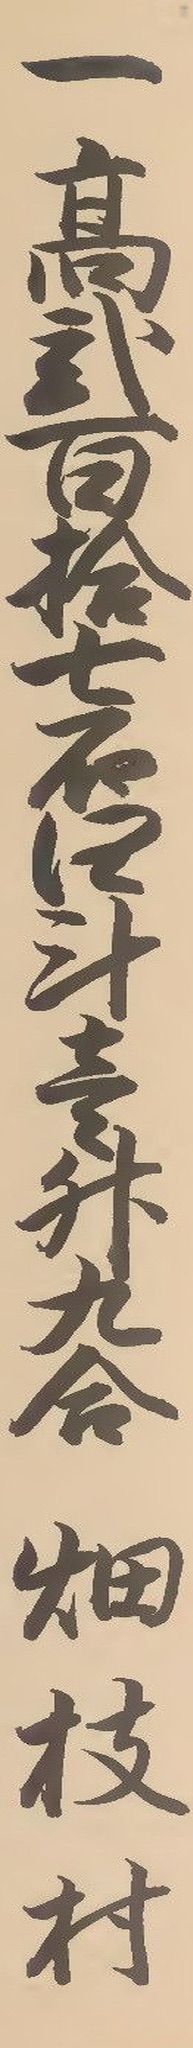一髙弐百拾七石四斗壱升九合畑枝村
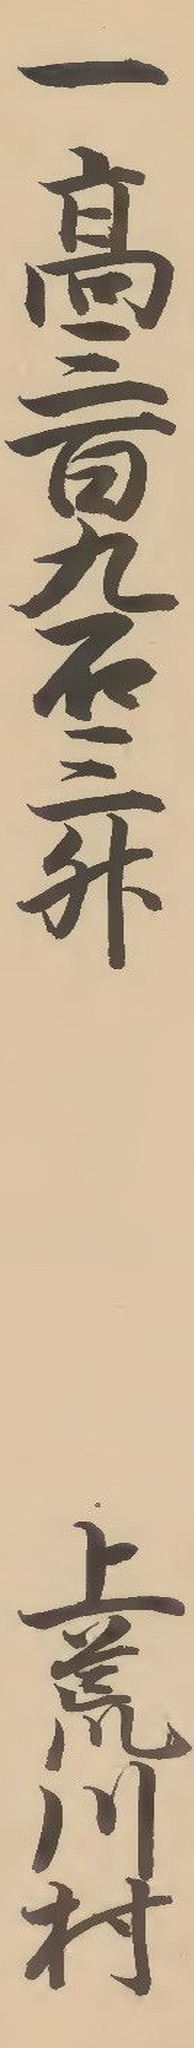一髙三百九石三升上荒川村
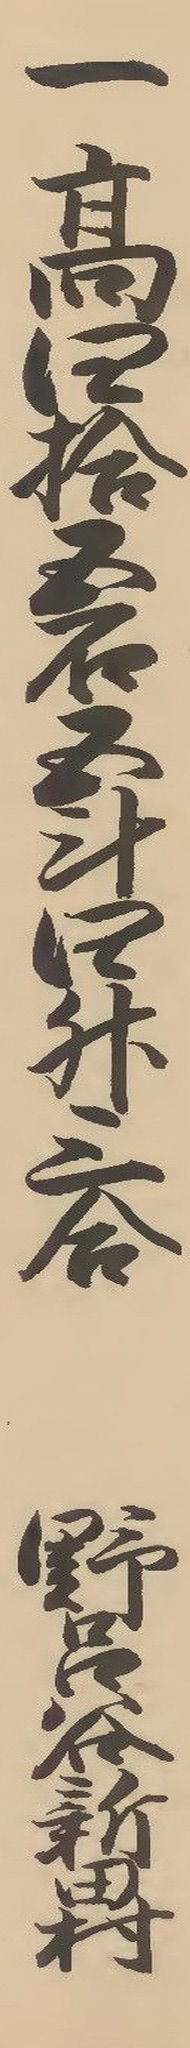一髙四拾五石五斗四升三合野呂谷新田村
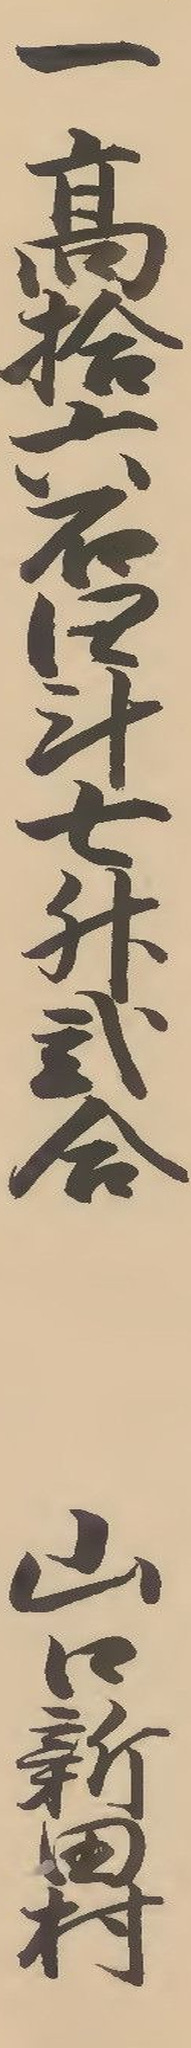一髙拾六石四斗七升弐合山口新田村

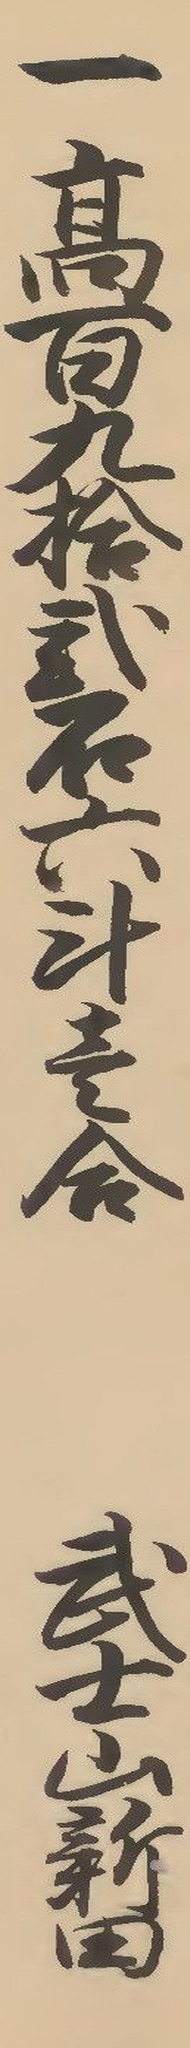一髙百九拾弐石六斗壱合武士山新田
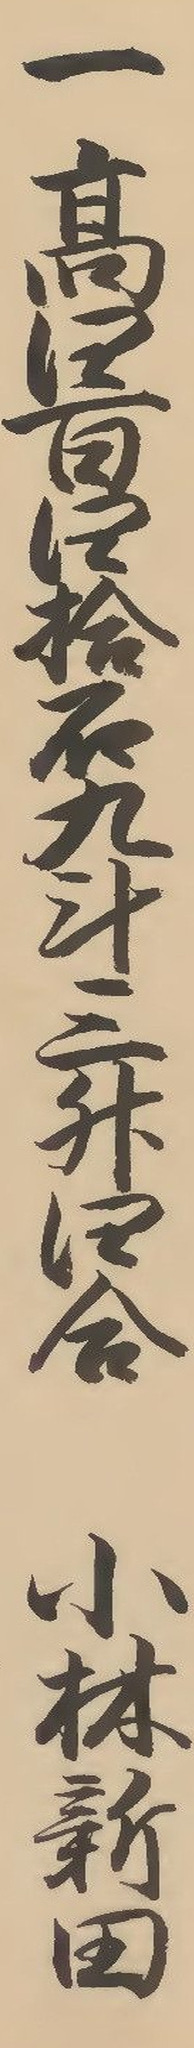一髙四百四拾石九斗三升四合小林新田
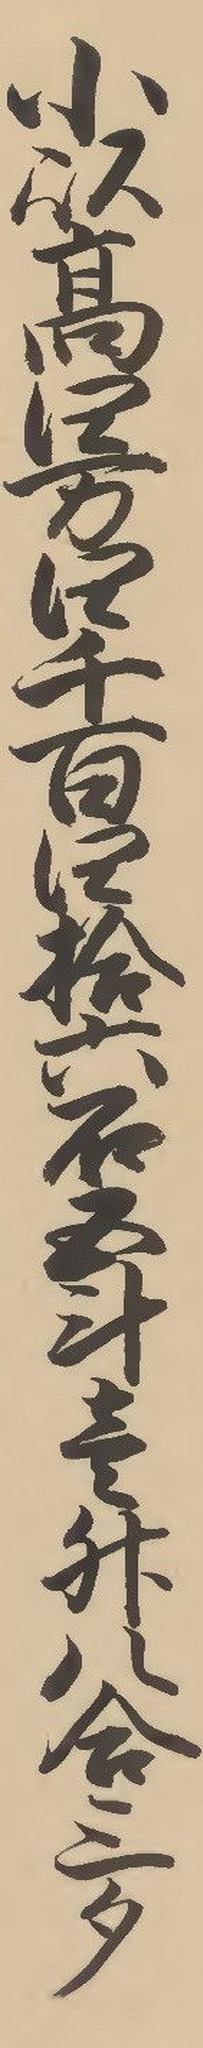小以髙四万四千百四拾六石五斗壱升八合三夕
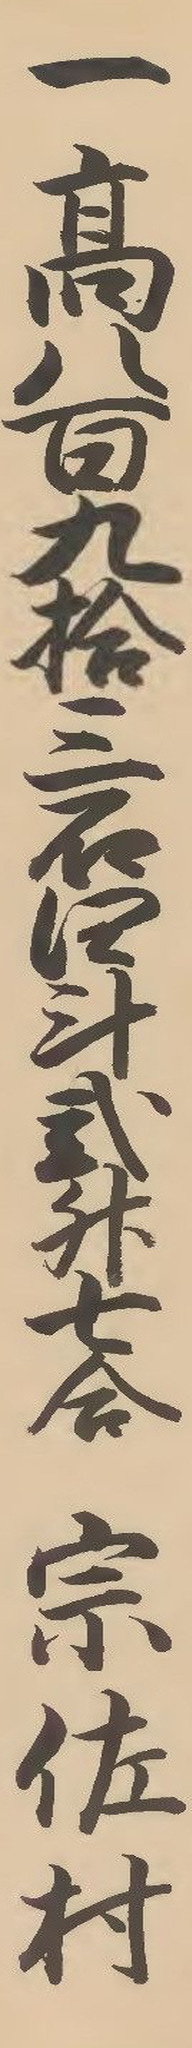一髙八百九拾三石四斗弐升七合宗佐村
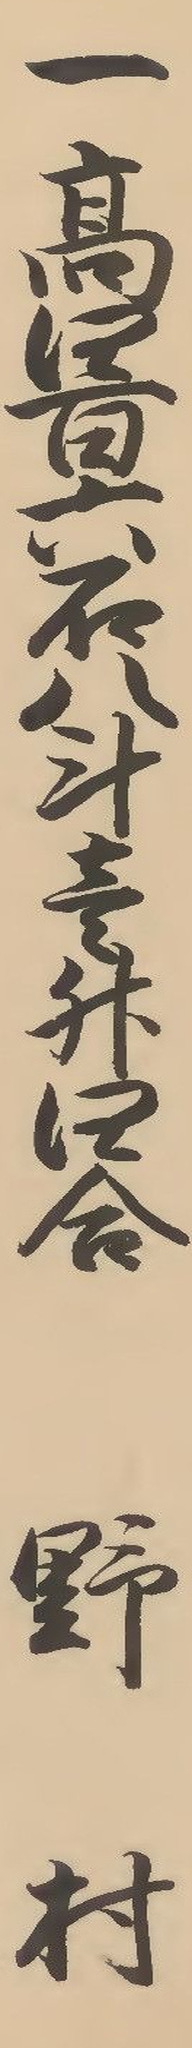一髙四百六石八斗壱升四合野村
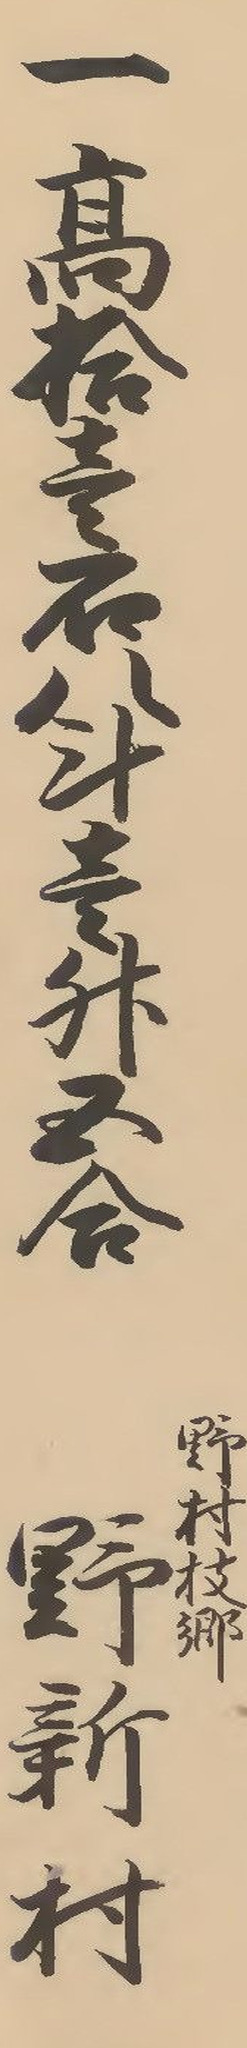一髙拾壱石八斗壱升五合野新村
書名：播磨国郷帳
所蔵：国立公文書館 National Archives of Japan
